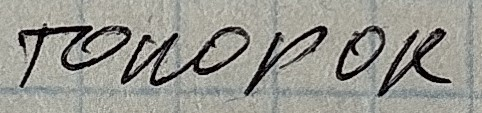топорок
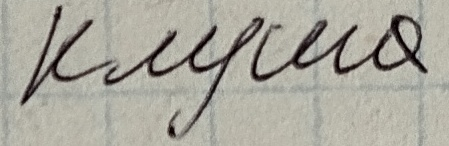клуша
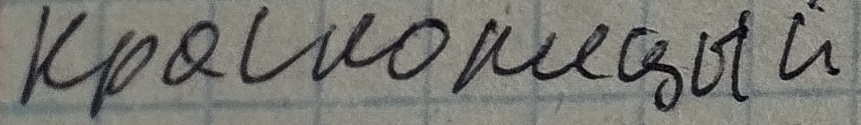краснолицый
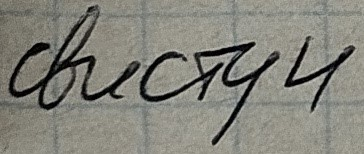свистун
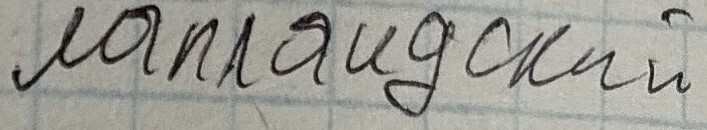лапландский
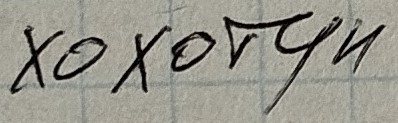хохотун
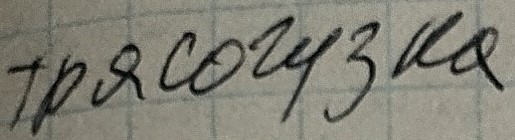трясогузка
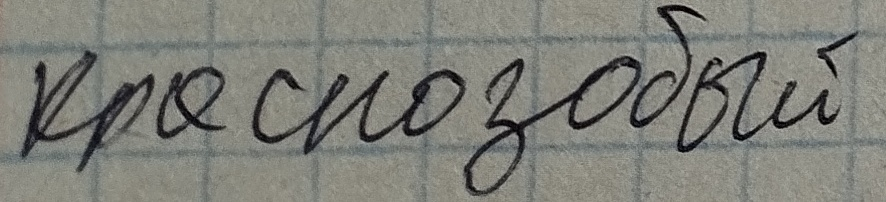краснозобый
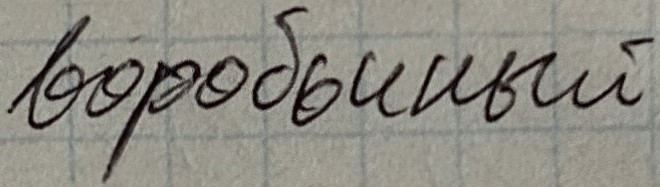воробьиный
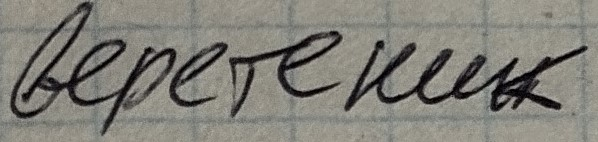веретеник
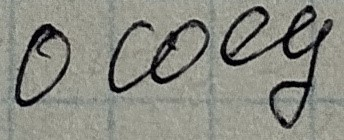о соед
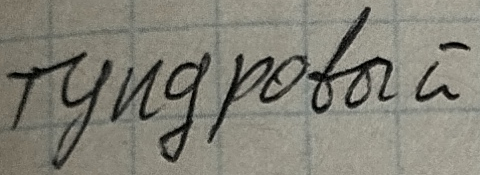тундровый
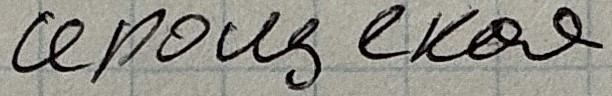серощекая
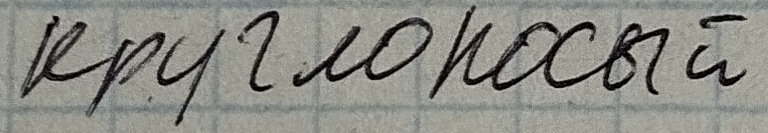круглоносый
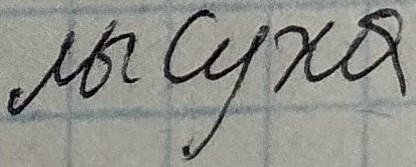лысуха
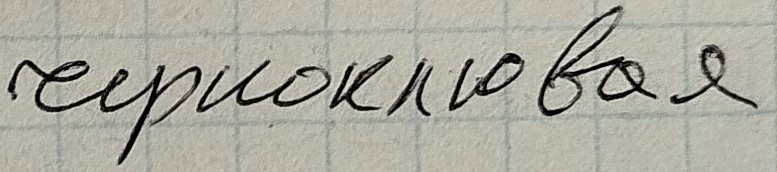черноклювая
